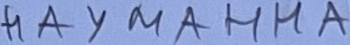науманна
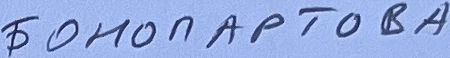бонопартова
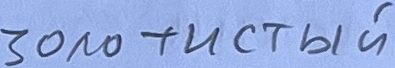золотистый
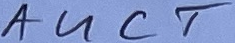аист
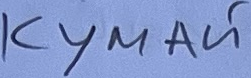кумай
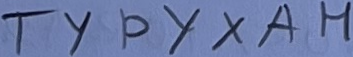турухан
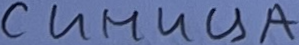синица
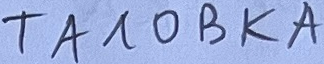таловка
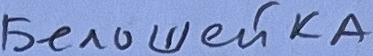белошейка
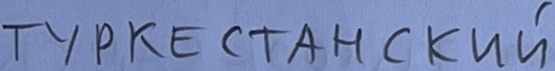туркестанский
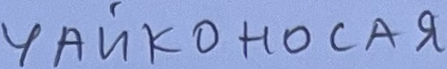чайконосая
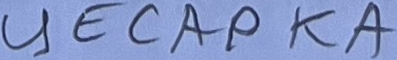цесарка
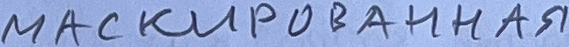маскированная
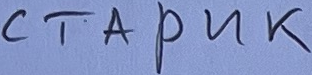старик
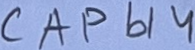сарыч
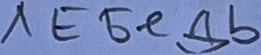лебедь
